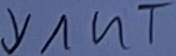улит
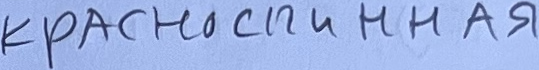красноспинная
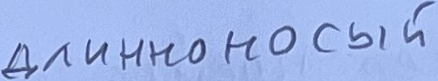длинноносый
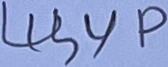щур
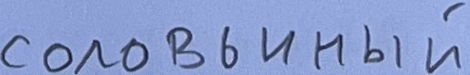соловьиный
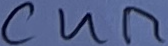сип
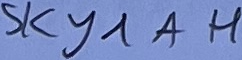жулан
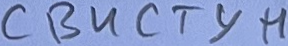свистун
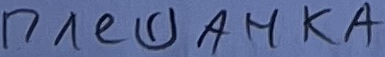плешанка
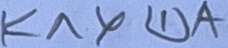клуша
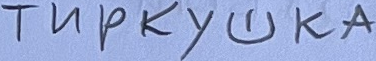тиркушка
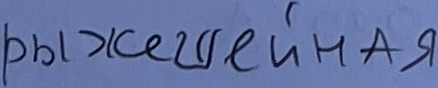рыжешейная
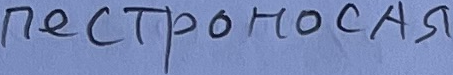пестроносая
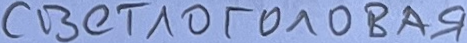светлоголовая
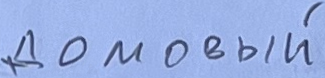домовый
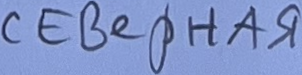северная
